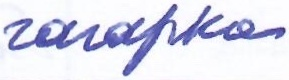гагарка
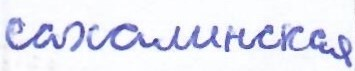сахалинская
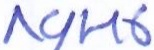лунь
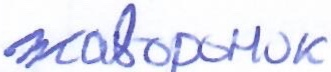жаворонок
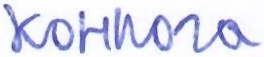конпога
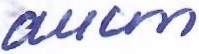аист
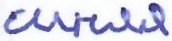синяя
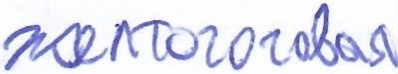желтогоговая
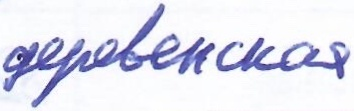деревенская
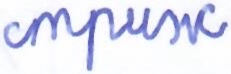стриж
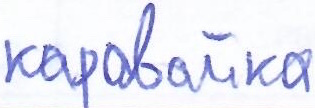каравайка
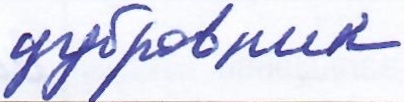дубровник
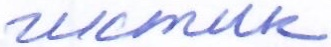чистик
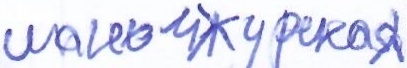маньчжурская
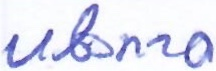иволга
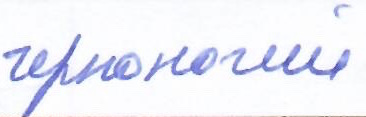черноногий
